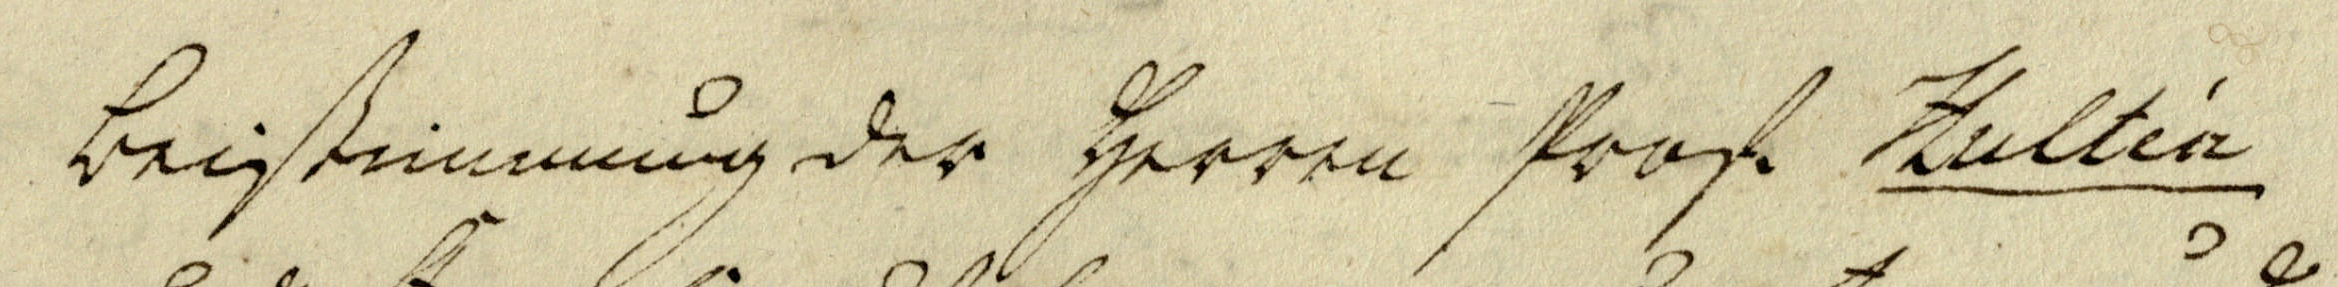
Beistimmuung der Herren Prof. Hultén
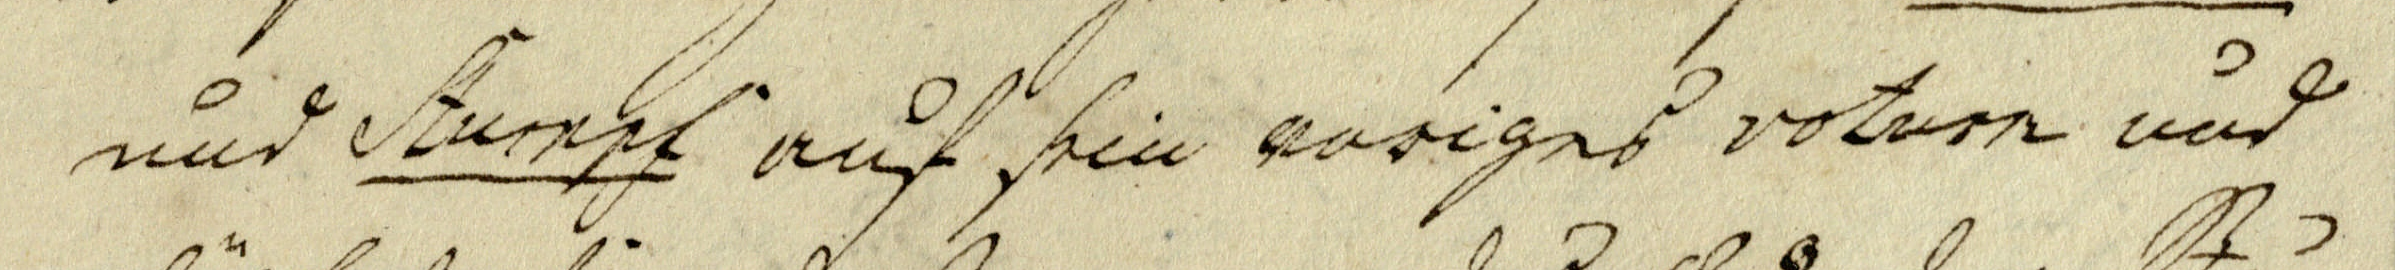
und Stumpf auf sein voriges votum und
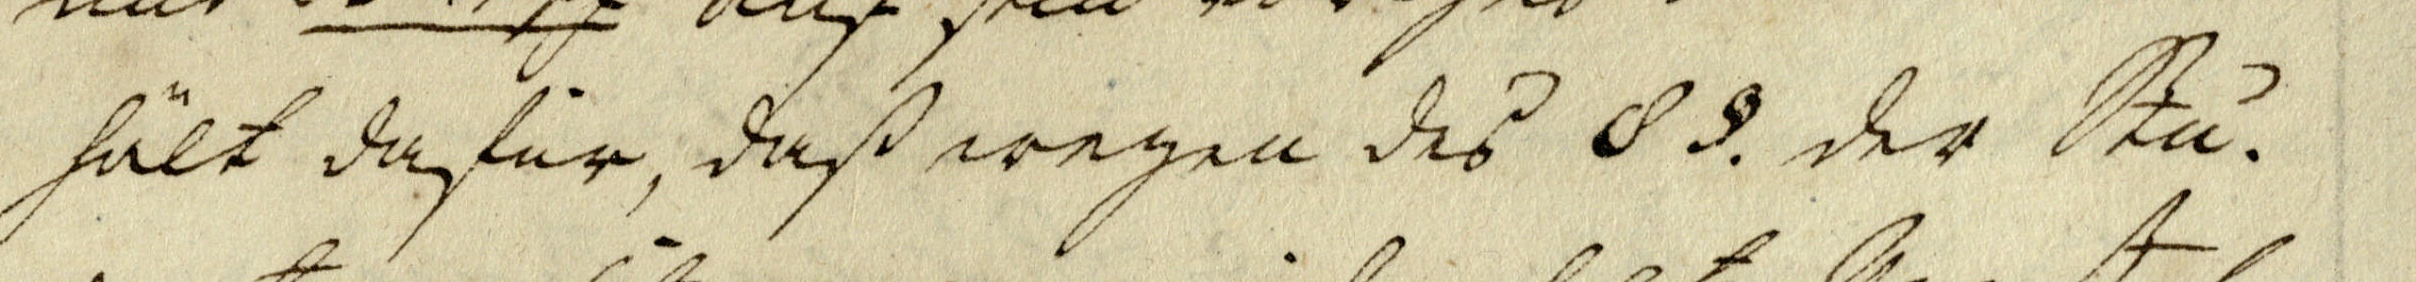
hält dafür, daß wegen des 8 §. der Stu¬
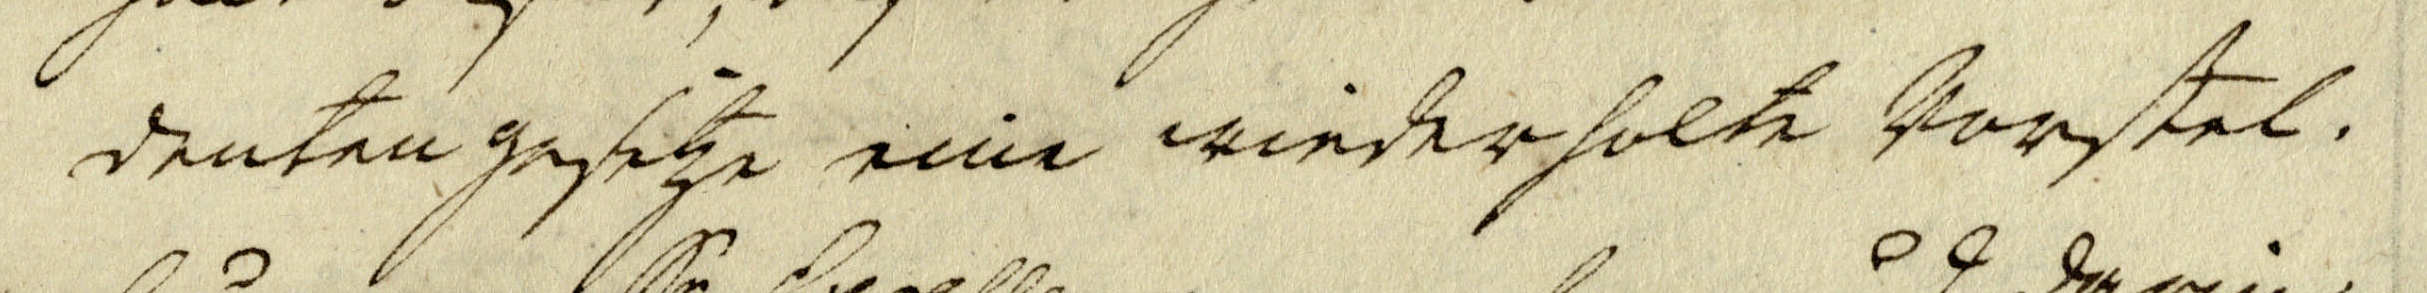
denten Gesetze eine wiederholte Vorstel¬
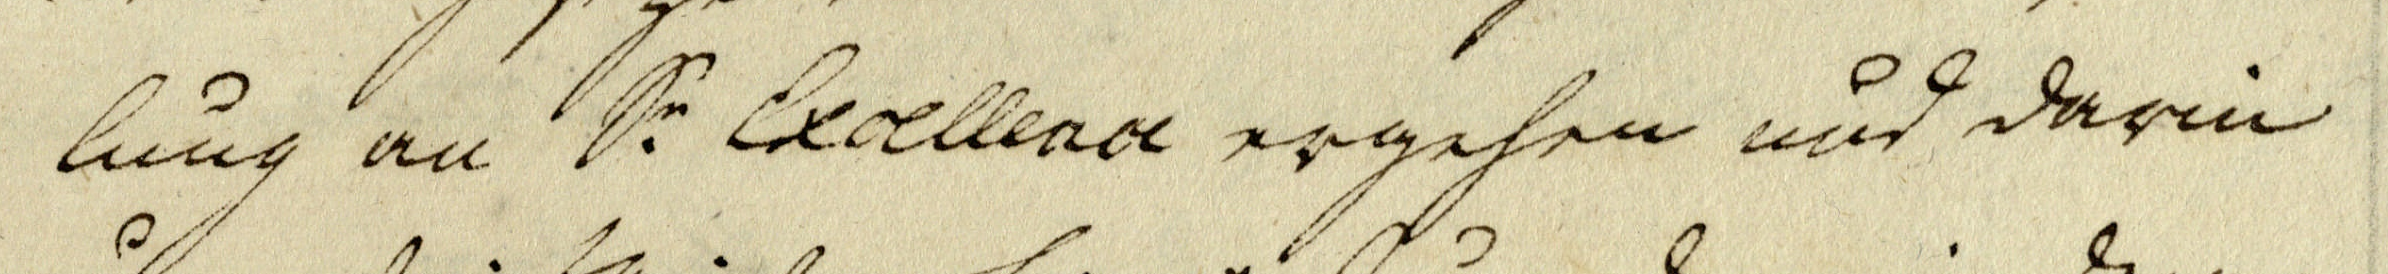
lung an Sr Excellence ergehen und darin
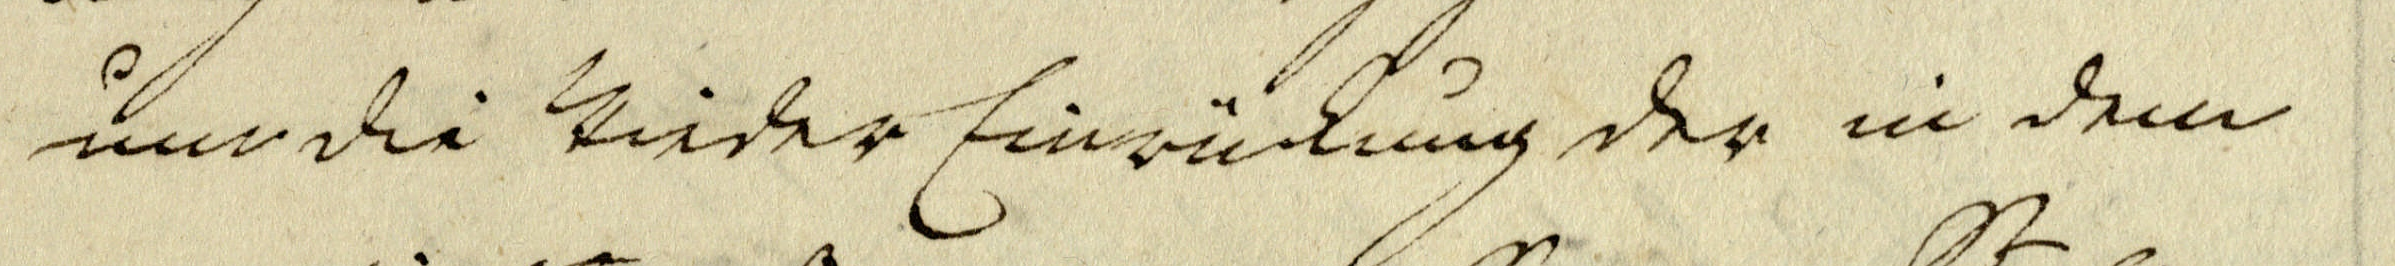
um die Wieder Einrückung der in dem
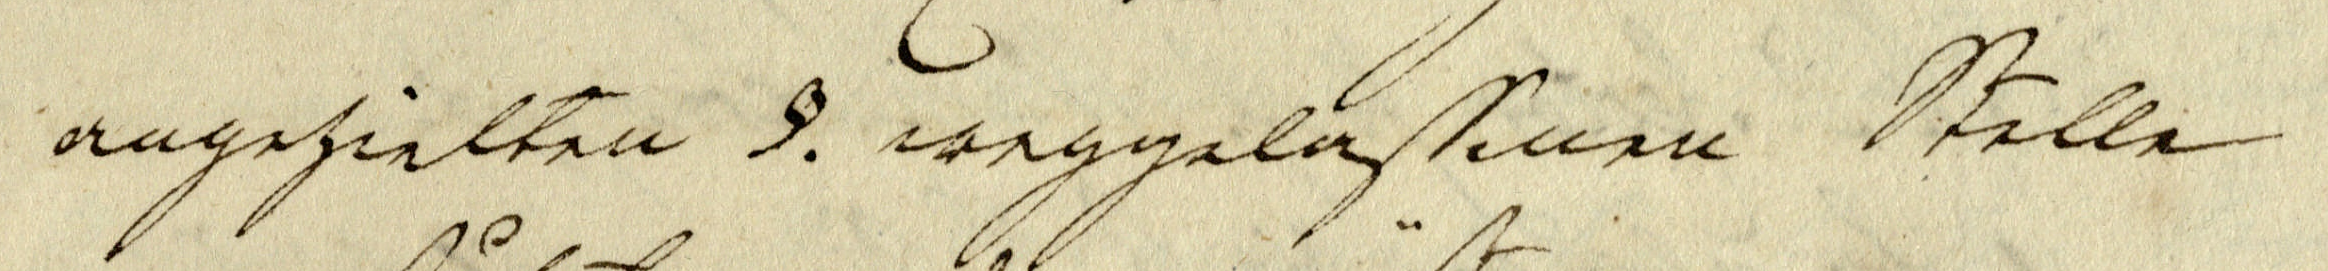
angezielten §. weggelassenen Stelle
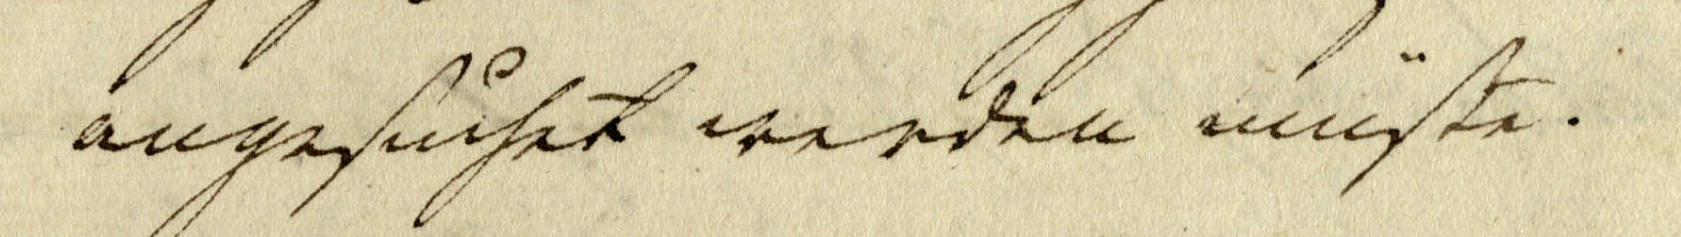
angesuchet werden müßte.
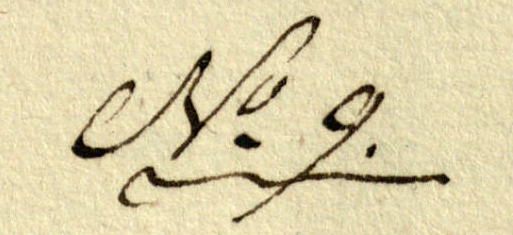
No 9.
